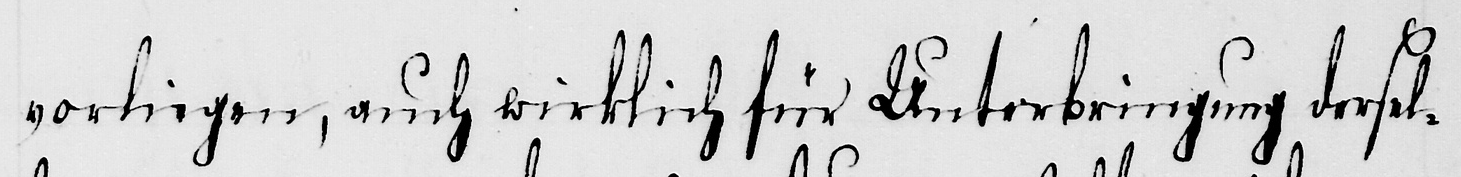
vorliegen, auch wirklich für Unterbringung dersel¬
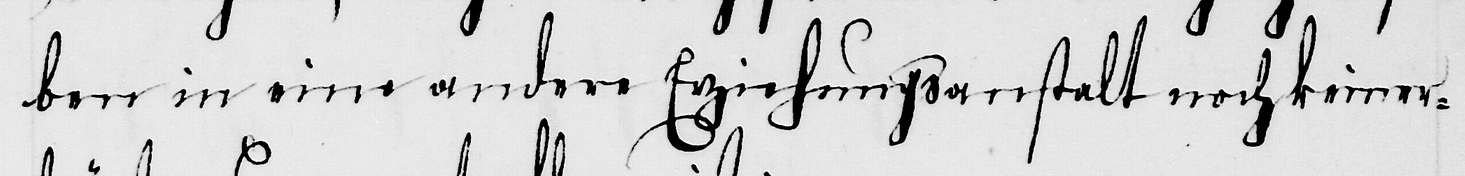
ben in eine andere Erziehungsanstalt noch keiner¬
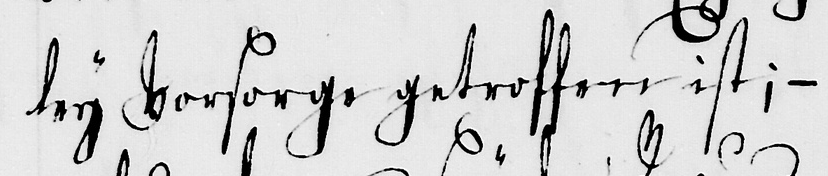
ley Vorsorge getroffen ist; –
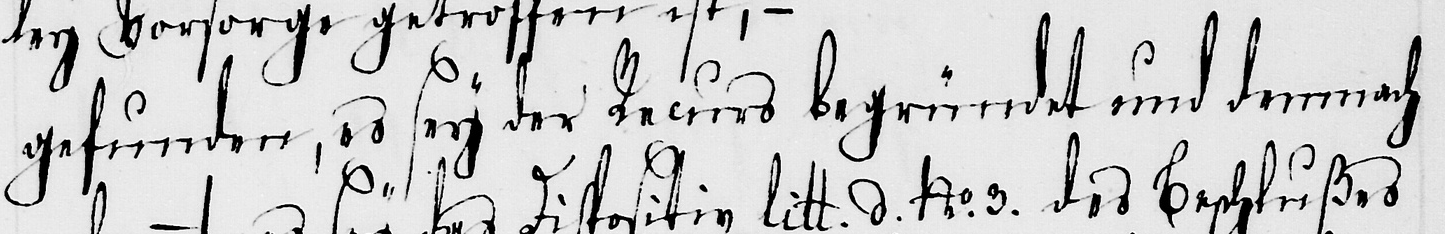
gefunden, es sey der Recurs begründet und demnach
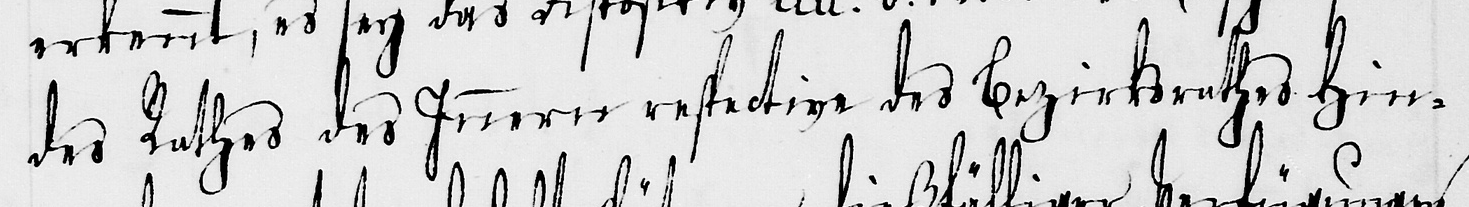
des Rathes des Innern respective des Bezirksrathes Hin¬
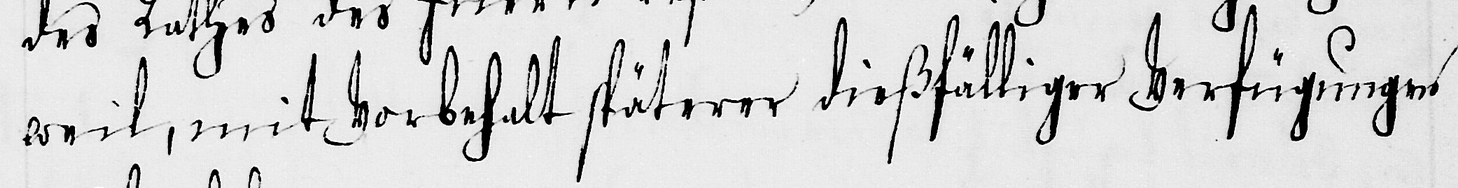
weil, mit Vorbehalt späterer dießfälliger Verfügungen
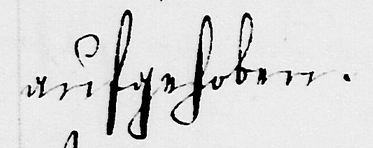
aufgehoben.
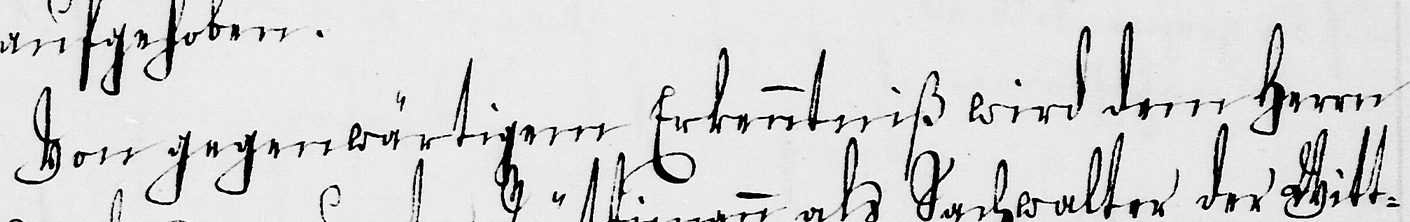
Von gegenwärtigem Erkenntniß wird dem Herrn
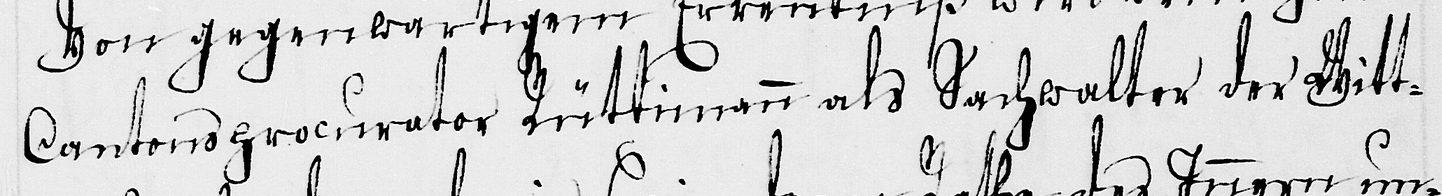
Cantonsprocurator Rüttimann als Sachwalter der Witt¬
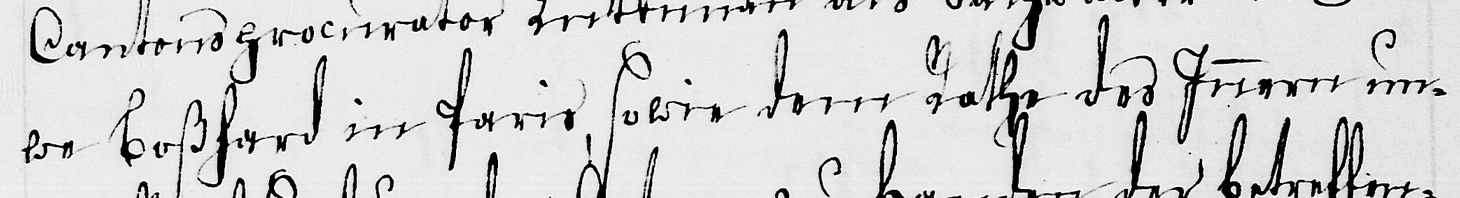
we Boßhard in Paris, sowie dem Rathe des Innern un¬
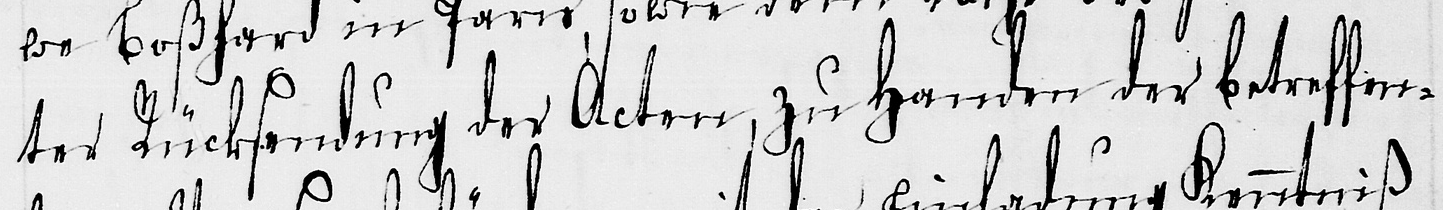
ter Rücksendung der Acten, zu Handen der betreffe¬
